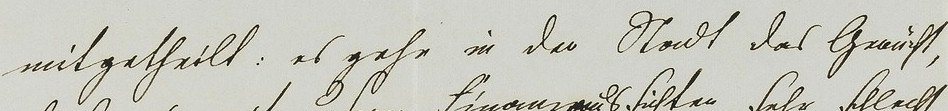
mitgetheilt: es gehe in der Stadt das Gerücht,
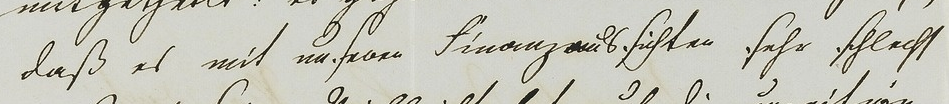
daß es mit unseren Finanzaussichten sehr schlecht
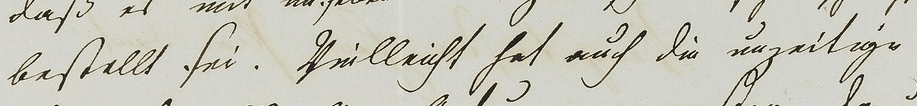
bestellt sei. Vielleicht hat auch die unzeitige
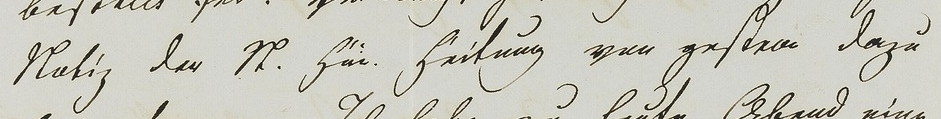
Notiz der N. Zür. Zeitung von gestern dazu
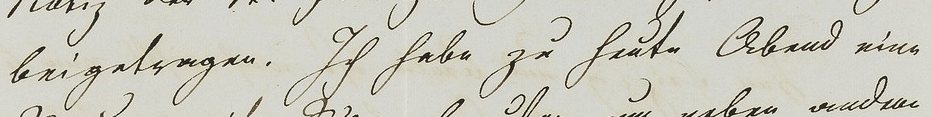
beigetragen. Ich habe zu heute Abend eine
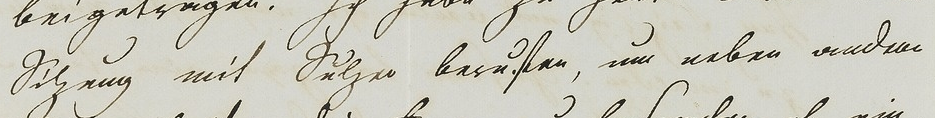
Sitzung mit Sulzer berufen, um neben andern
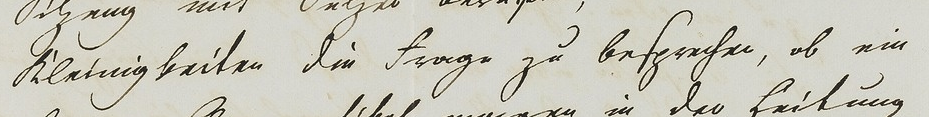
Kleinigkeiten die Frage zu besprechen, ob ein
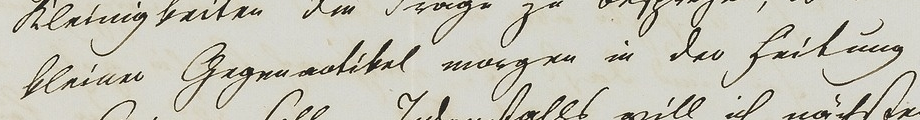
kleiner Gegenartikel morgen in der Zeitung
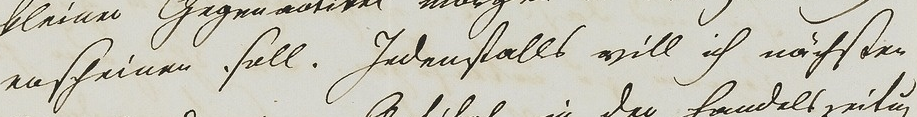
erscheinen soll. Jedenfalls will ich nächsten
